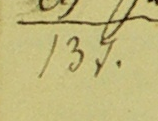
137
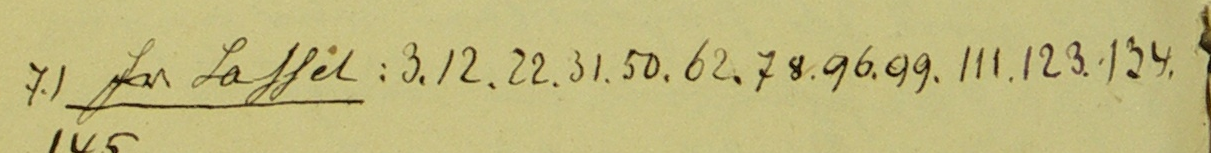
7) Fr. Lassel; 3.12.22.31.50.62.78.96.99.111.123.134.
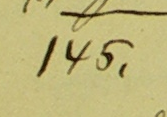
145.
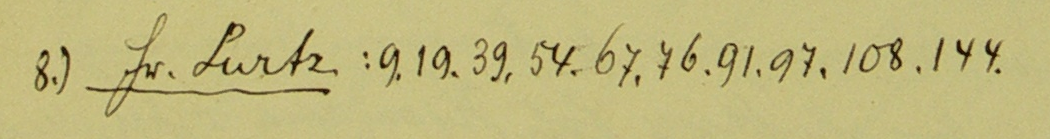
8) Fr. Lurtz; 9.19.39.54.67.76.91.97.108.144.
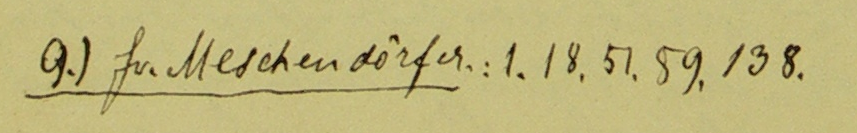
9) Fr.Meschendörfer: 1.18.51.89.138.
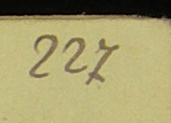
227
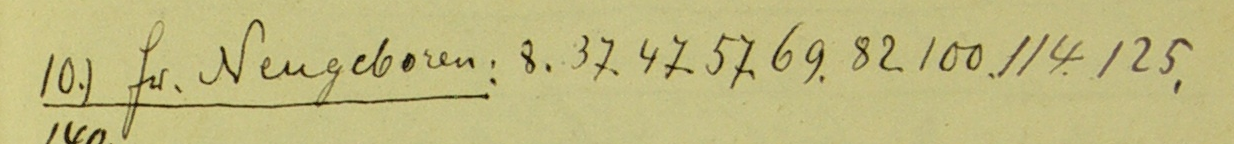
10) Fr. Neugeboren: 8.37.47.57.69.82.100.114.125.
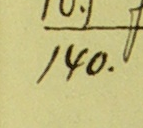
140.
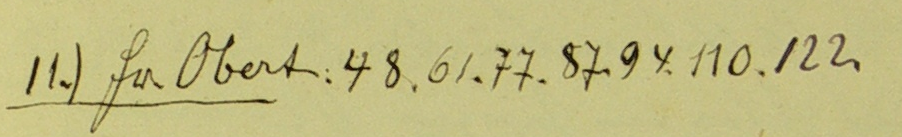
11) Fr. Obert: 48.61.77.87.94.110.122.
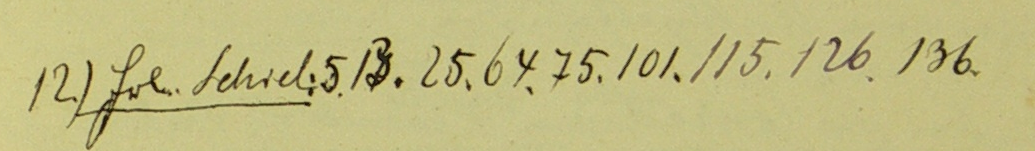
12) Frl. Schiel: 5.13.25.64.75.101.115.126.136.
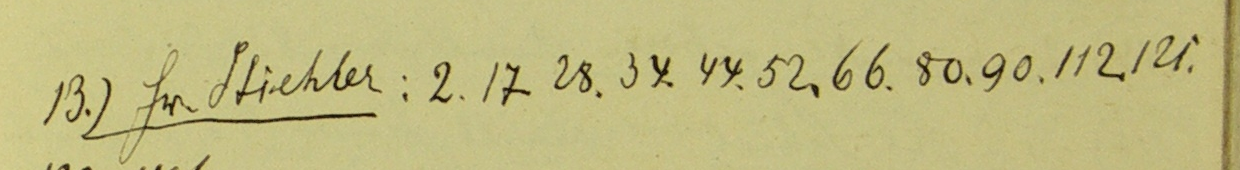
13) Fr. Stiehler: 2.17.28.34.44.52.66.80.90.112.125.
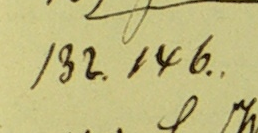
132.146.
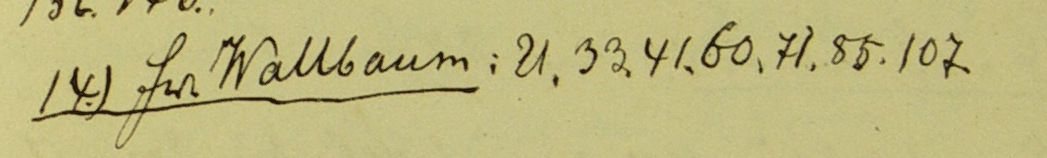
14) Fr. Wallbaum: 21.33.41.85.107.
